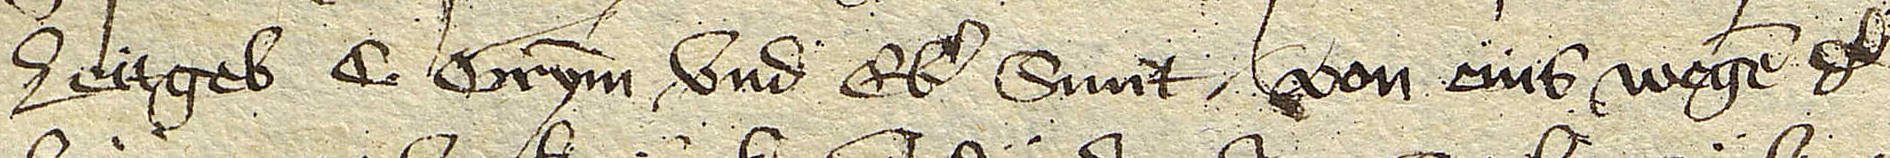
Leitgeb C . Grym / vnd Eb* Smit / von eins wege* d*
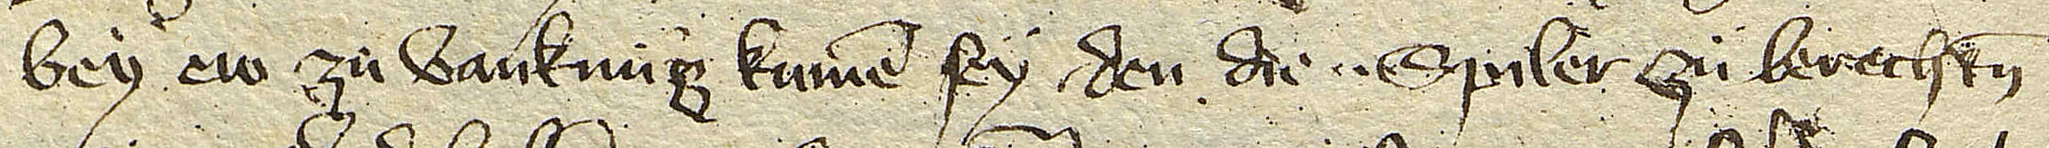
bey ew ʒu vanknüʒʒ kume* ſey / den die ~ Spiler cʒü berechtn*
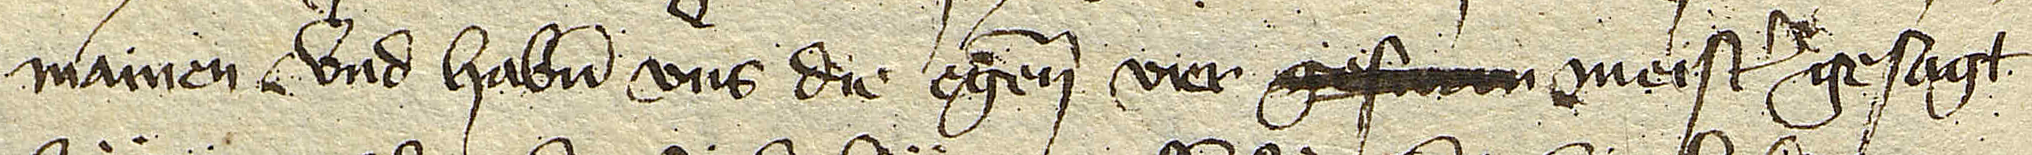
mainen / vnd habn* vns die egen* vier geſworn meiſt* geſagt
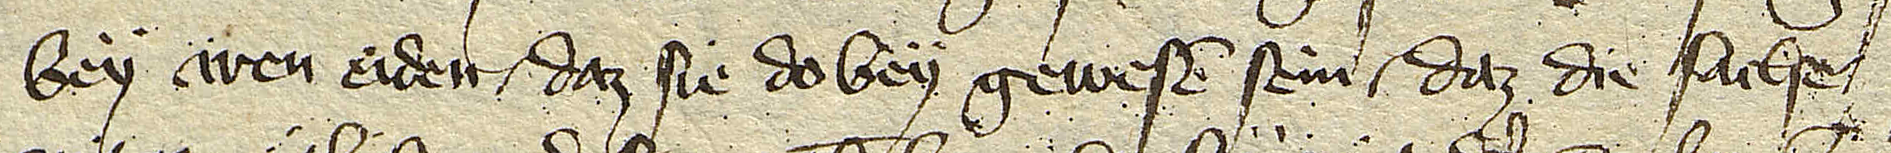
bey iren eiden / daʒ ſie do bey geweſe* ſein / daʒ die ſache
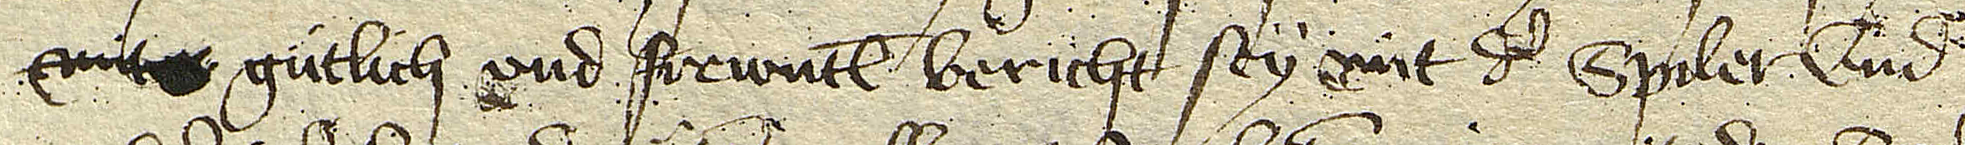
mit gütlich vnd frewntl* bericht ſey mit d* Spiler vnd
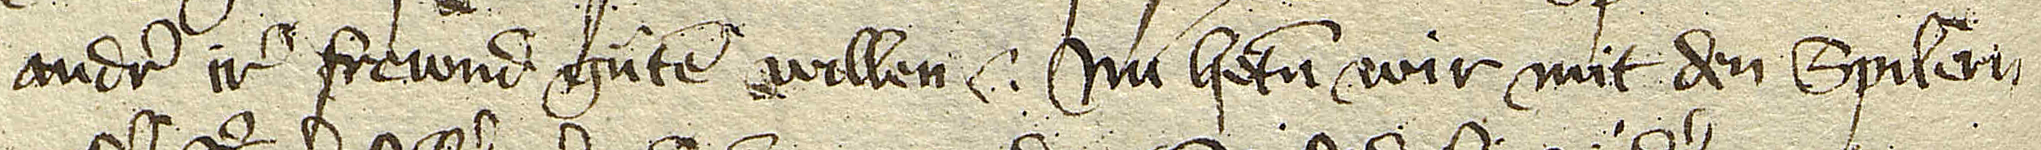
andr* ir* frewnd güte* willen / . Nu hetn* wir mit den Spiler
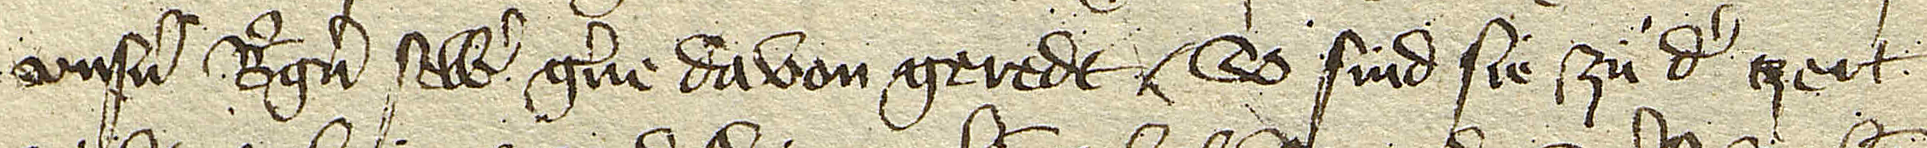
vnſn* B*gn* ſelb* g*ne davon geredt / So ſind ſie cʒü d* cʒeit
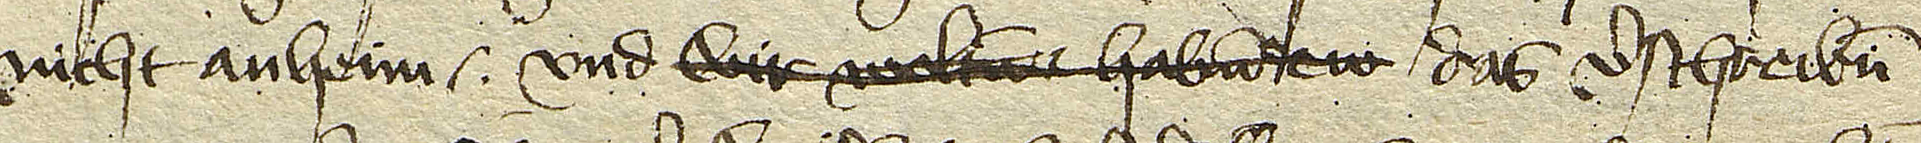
nicht anheim / . vnd wir woltn* habn* ew das v*ſchreibn*
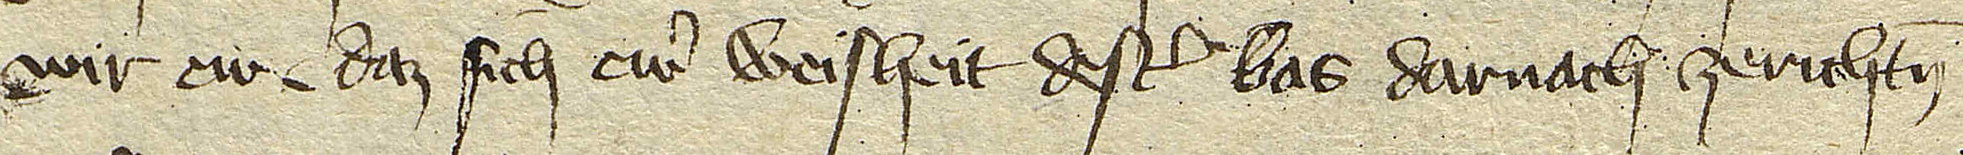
wir ew / daʒ ſich ew* weiſheit deſt* bas darnach cʒerichtn*
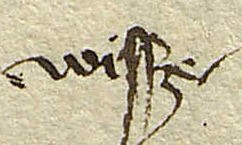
wiſſʒe /
